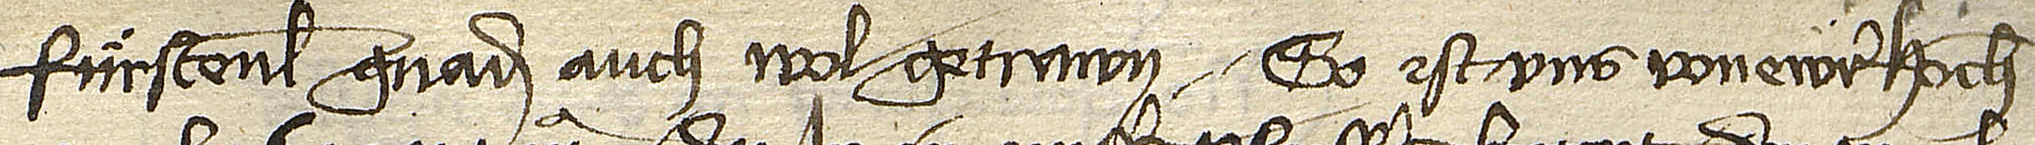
fürſtenl* gnad* auch wol getrawn / So iſt vns von eẅr* Hoch*
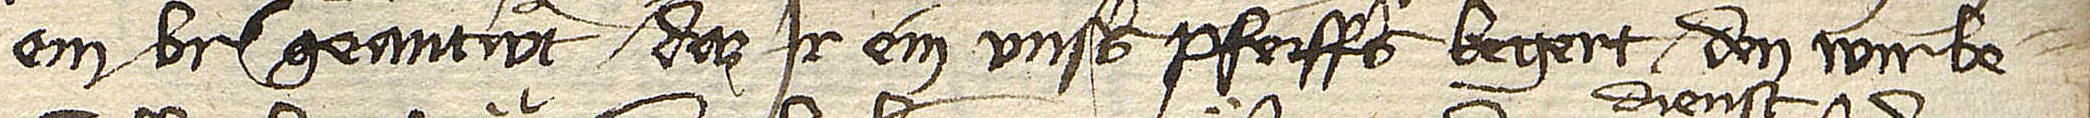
ein br* geantw*t / daʒ Ir ein vnſ*s Pfeiff*s begert / den wir be =
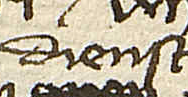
dienſt
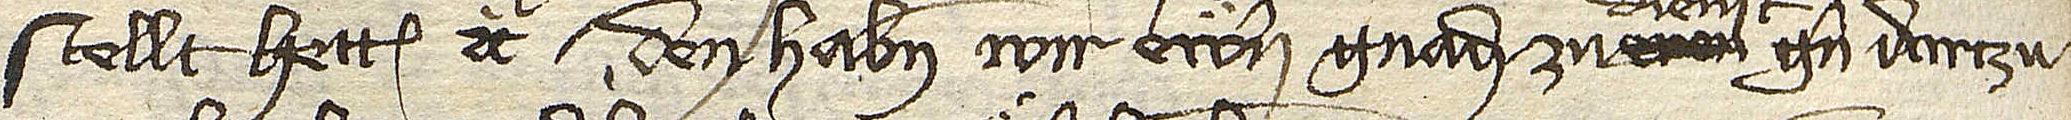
ſtellt hett* ec* / Den habn* wir eẅ*n gnad* ʒu eren g*n darcʒu
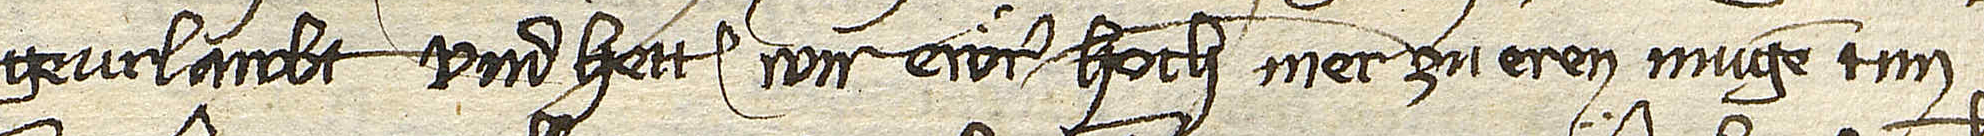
geurlawbt vnd hett* wir eẅr* hoch* mer ʒu eren muge* tun
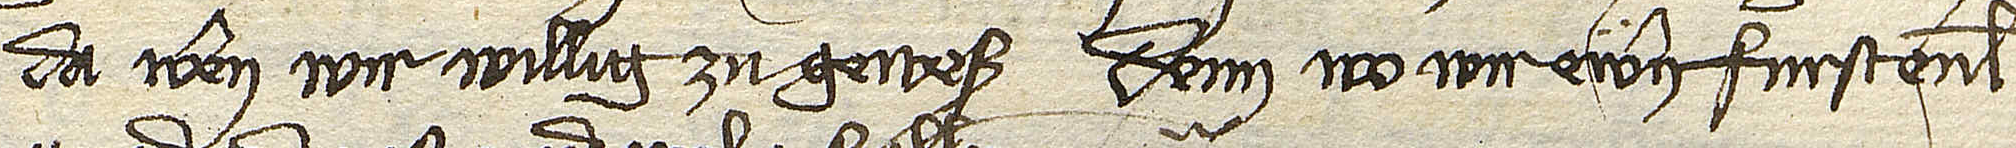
da w*en wir willig ʒu geweſ* Denn wo wir eẅ*n furſtenl*
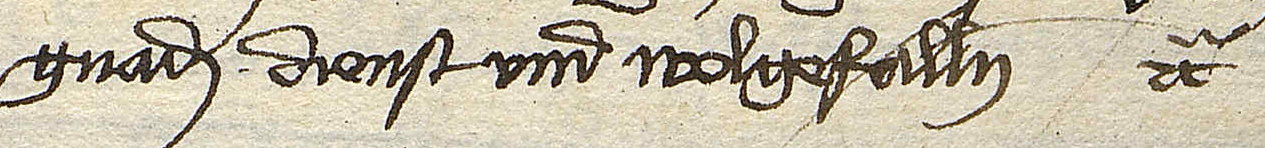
gnad* . dienſt vnd wolgefalln* ec*
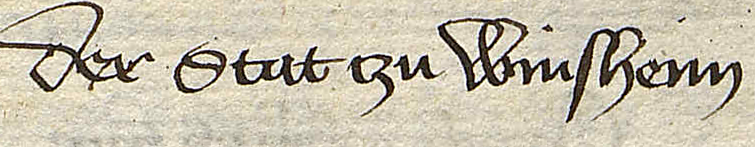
Der Stat cʒu Winſheim
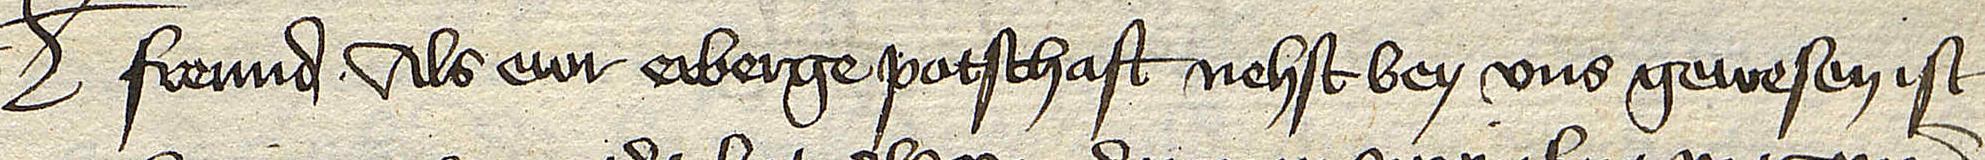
L* freund* . Als ewr erberge potſchaft nehſt bey vns geweſen iſt
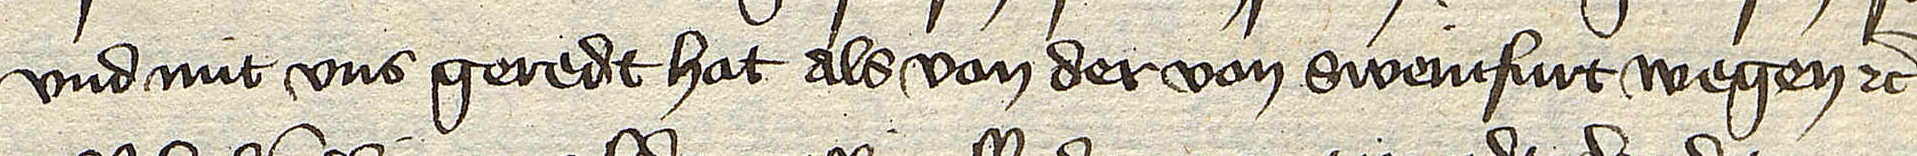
vnd mit vns geredt hat Als von der von Sweinfurt wegen ec*
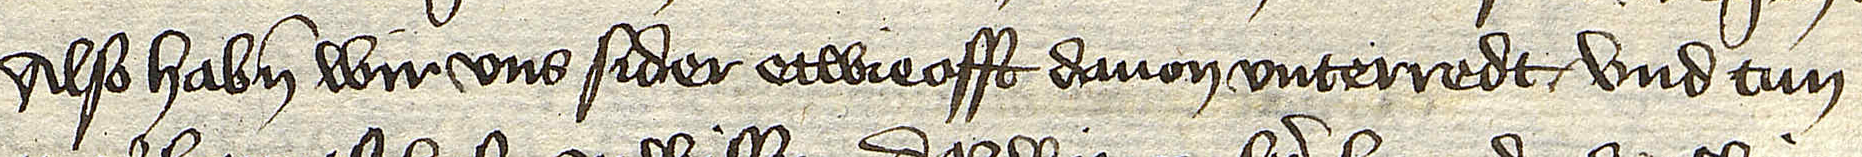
Alſo habn* wir vns ſider etwieofft dauon vnterredt / vnd tun
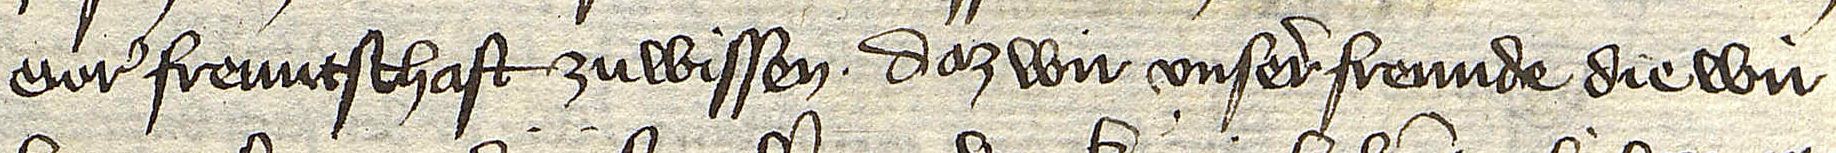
ewr* freuntſchaft ʒu wiſſen . daʒ wir vnſer* freunde die wir
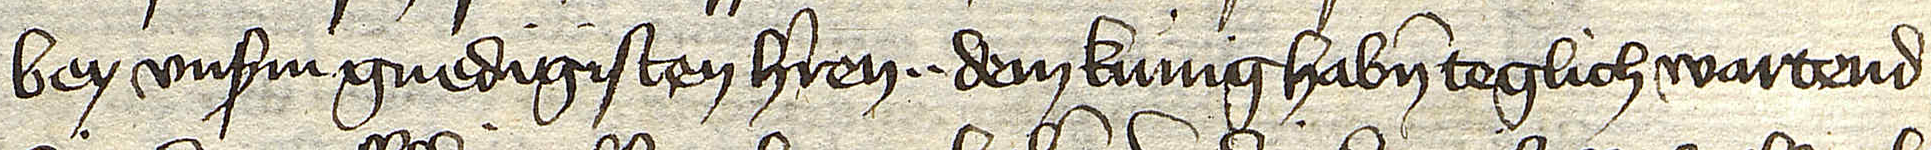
bey vnſ*m gnedigiſten h*ren ~ dem künig habn* teglich wartend
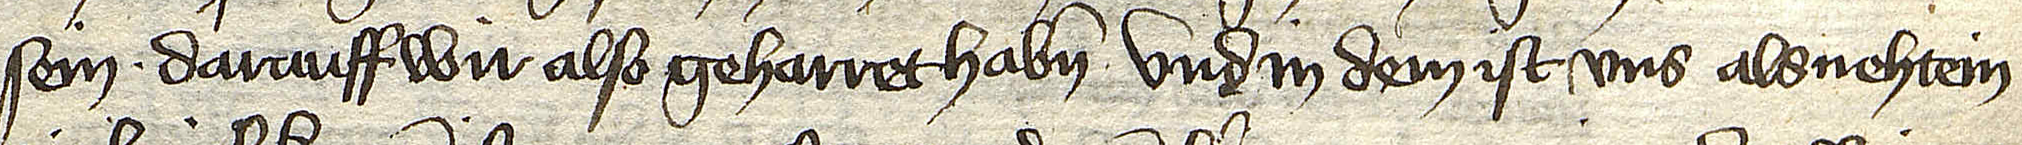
ſein . darauff wir alſo geharret habn* . vnd in dem iſt vns als nehtein
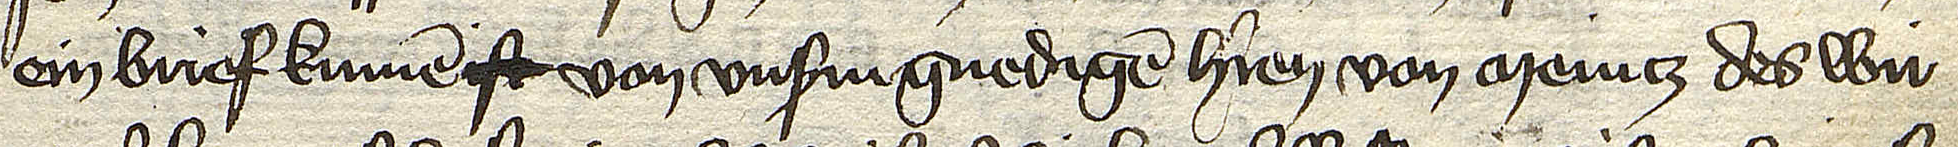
ein brief kume* iſt von vnſ*m gnedige* h*ren von Meincʒ des wir
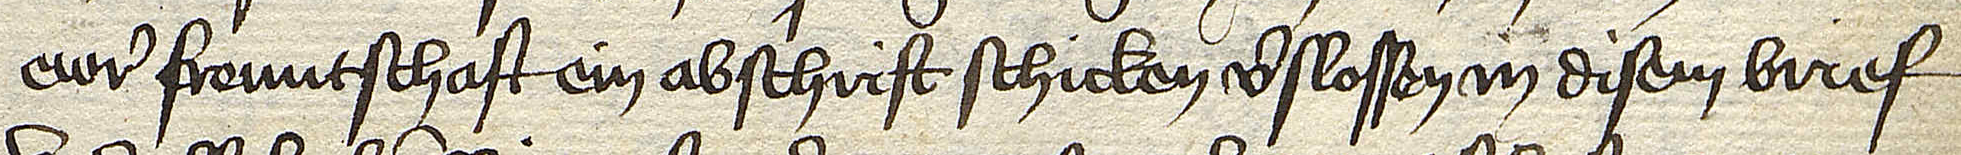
ewr* freuntſchaft ein abſchrift ſchicken v*ſloſſen in diſem brief
